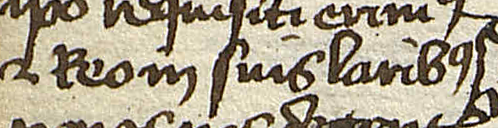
@ Reo in ſuis larib*
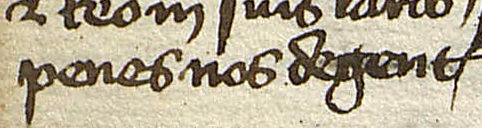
penes nos degent*
